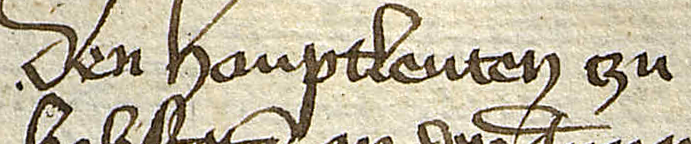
Den hauptleuten cʒu
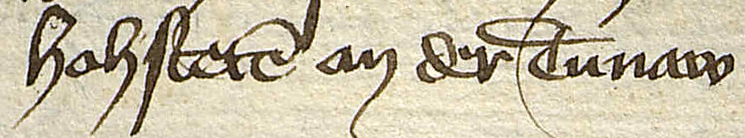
hohſtete* an der Tunaw
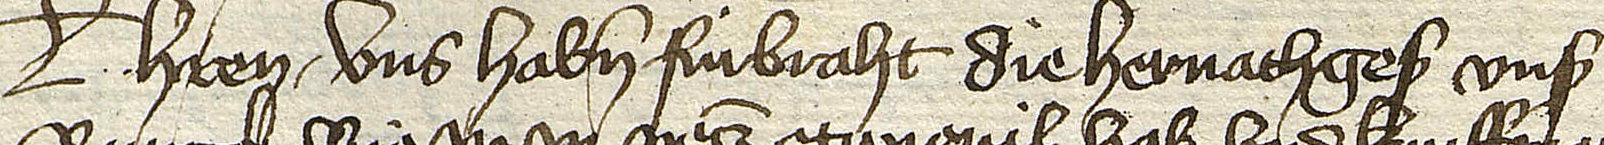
L* h*ren / Vnd habn* fürbraht die hernachgeſ* vnſ*
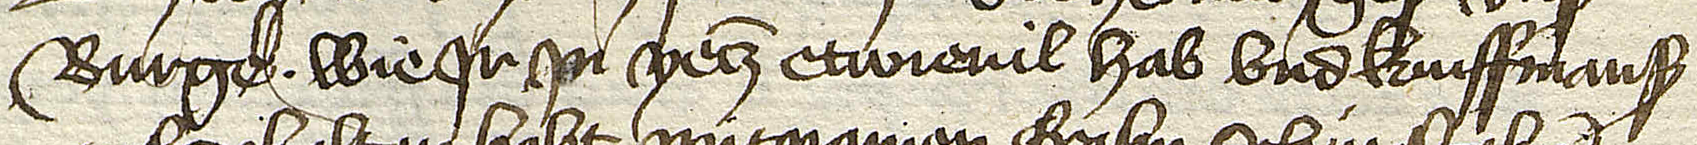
Burge* . wie Ir In yecʒ* etwieuil hab vnd kauffmanſ*
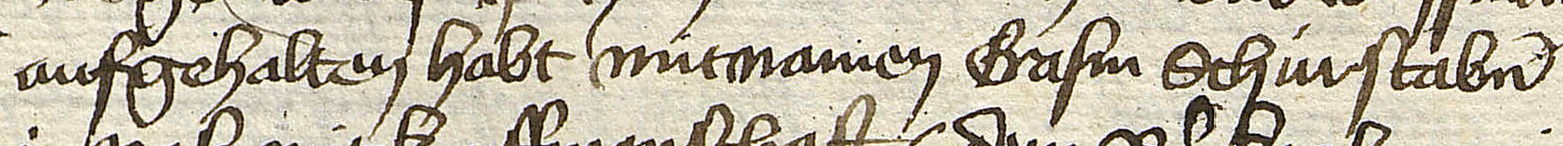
aufgehalten habt mitnamen Erafm Schürſtabn*
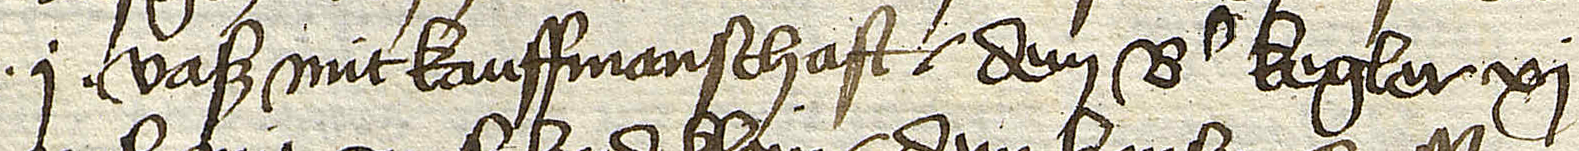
. i . vaſʒ mit kauffmanſchaft / dem B* kegler xi
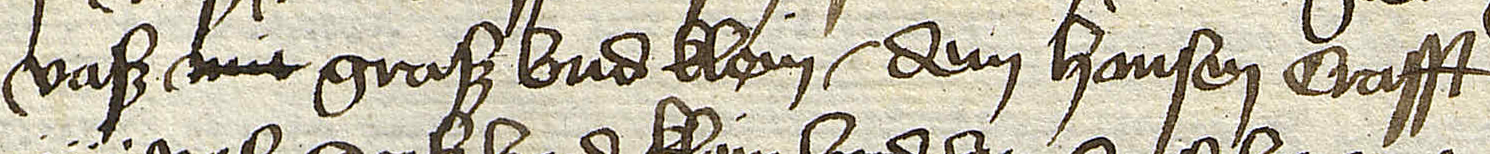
vaſʒ mit groſʒ vnd klein / dem hanſen Crafft
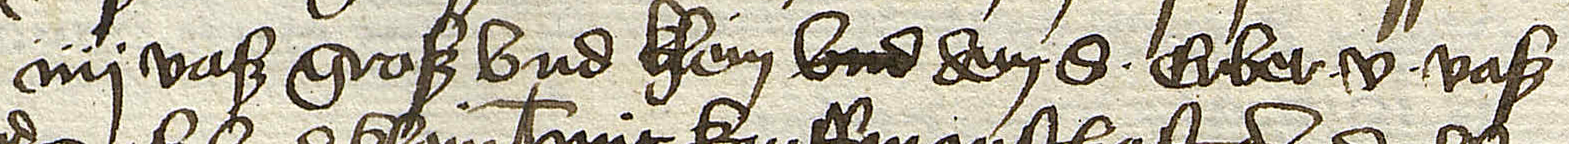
iiii vaſʒ groſʒ vnd klein vnd dem S . Erber . v . vaſʒ
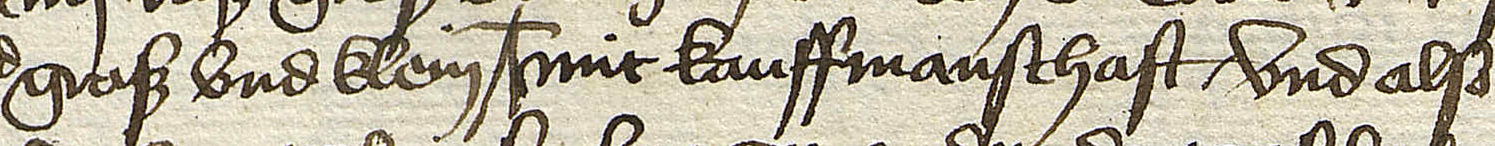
groſʒ vnd klein mit kauffmanſchaft / Vnd alſo
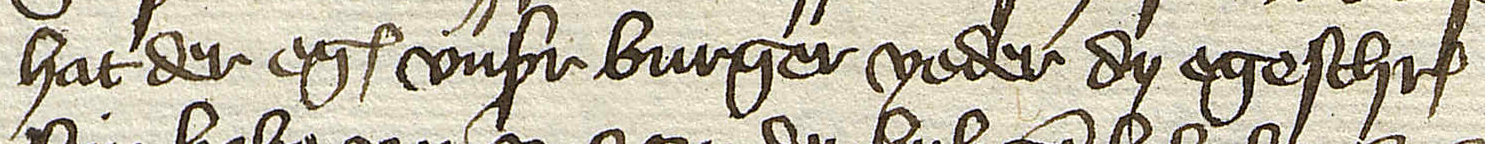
hat der eg* vnſ*r burger yeder dy egeſchr*
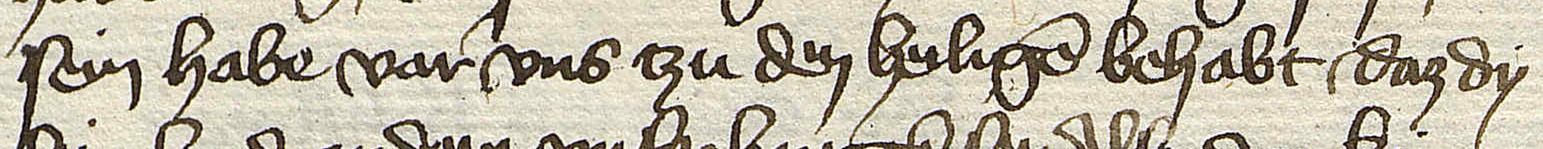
ſein habe vor vns cʒu den heilige* behabt / daʒ dy
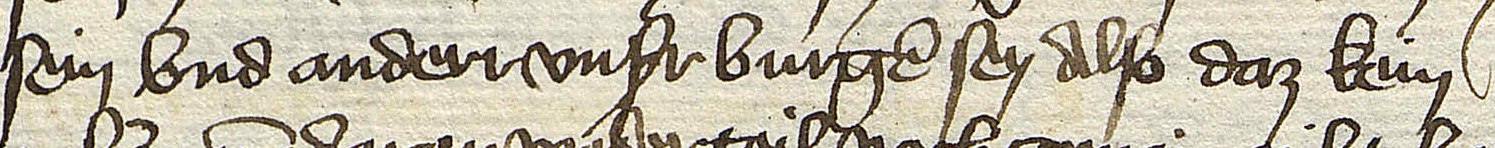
ſein vnd anderr vnſ*r burge* ſey Alſo daʒ kein
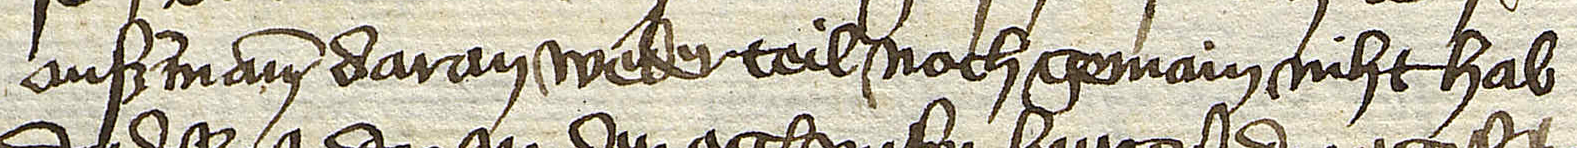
auſʒman* daran weder teil noch gemain niht hab
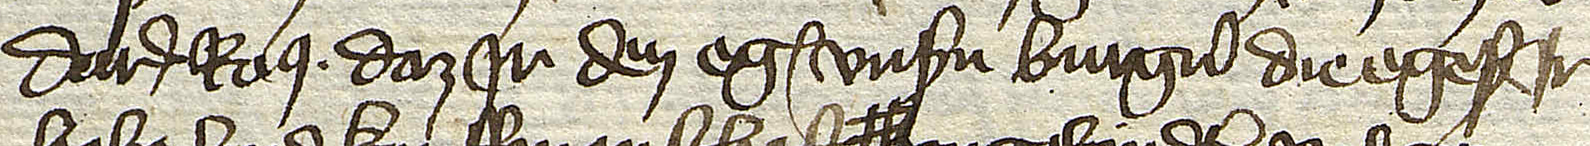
Dar* Ro* . daʒ Ir den eg* vnſ*n burgn* die egeſ* Ir
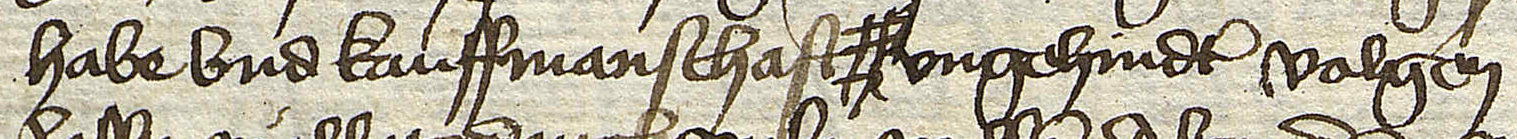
habe vnd kauffmanſchaft vngehindt* volgen
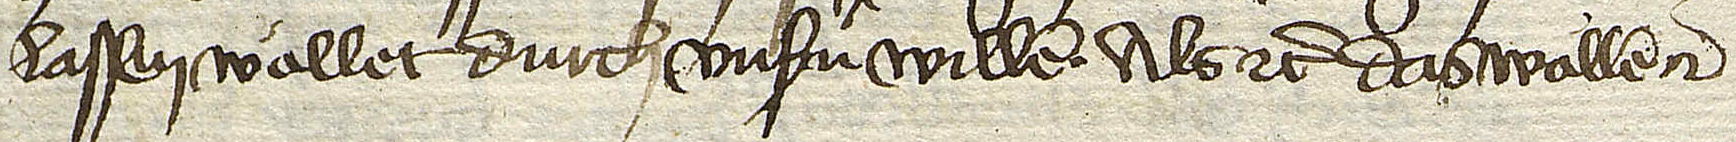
laſſen wöllet durch vnſ*n wille* . Als ec* das wölle* ec*
